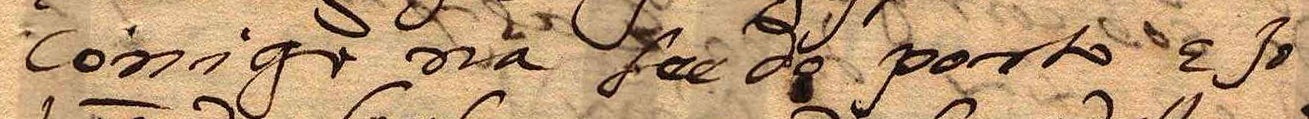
conigo na see de porto E Jo
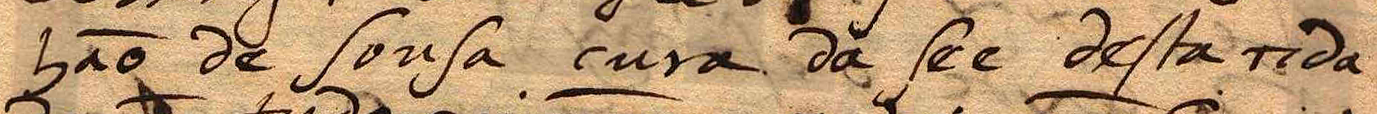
hão de SouSa cura da See desta cida
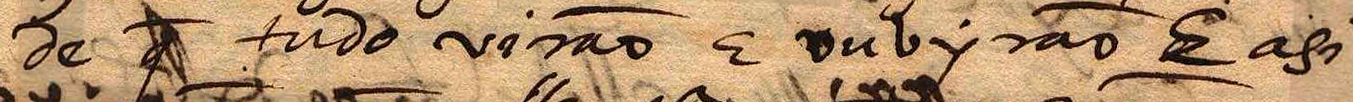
de q̄ tudo virão E ouvyraõ E asi
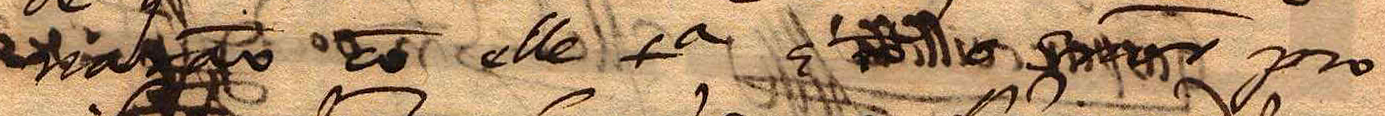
narão cō elle ta E c̄o o sn̄or pro
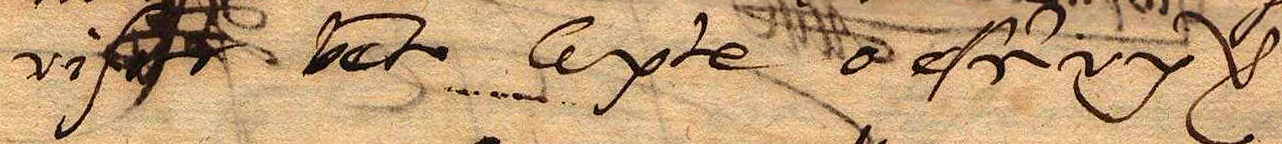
visor bēto leyte o esc̄vy
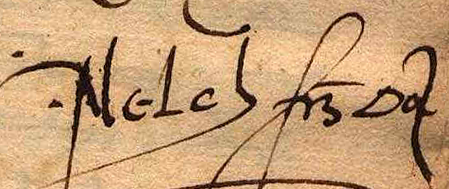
Melch frz̄
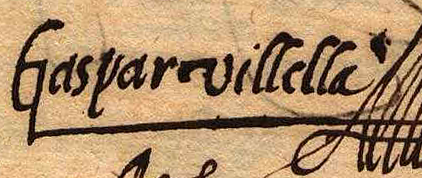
Gaspar villella
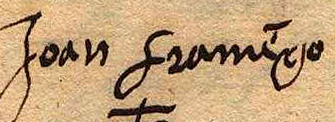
Joan framēgo
